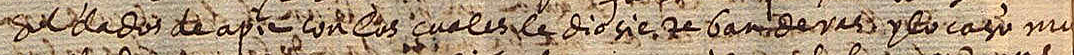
soldados de a pie con los cuales le dio siete banderas y lo caso mu
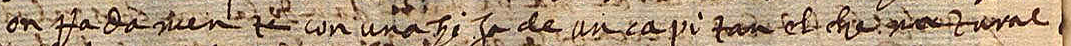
onRadamente con una hiJa de un capitan elche natural
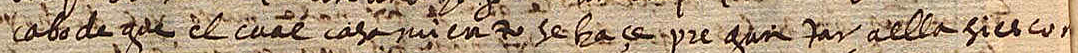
cabo de gue el cual casamiento se hace preguntar a ella si es co
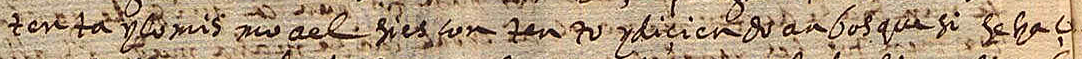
tenta y lo mismo a el si es contento y diciendo anbos que si se haç
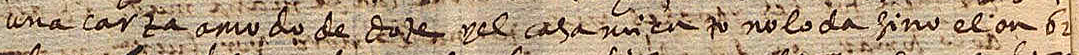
una carta a modo de dote y el casamiento no lo da sino el onbr
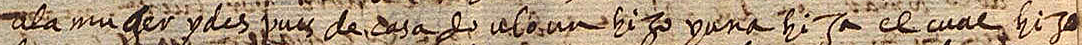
a la muger y despues de casado ubo un hiJo y una hiJa el cual hiJo
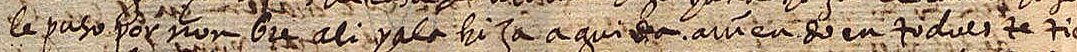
le puso por nonbre ali y ala hiJa aguida auiendo en todo este tie
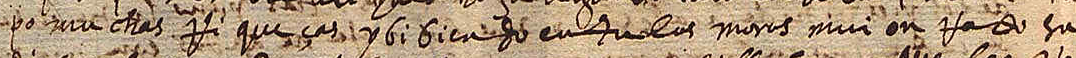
po muchas Riqueças y bibiendo entre los moros mui onRado su
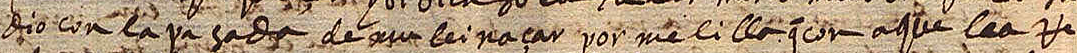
dio con la pasada de mulei naçar por melilla q̄ con aquella Re
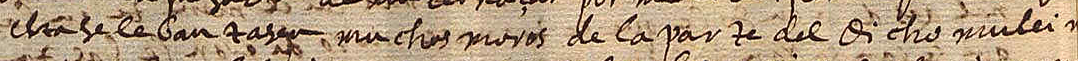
elta se lebantasen muchos moros de la parte del dicho mulei n
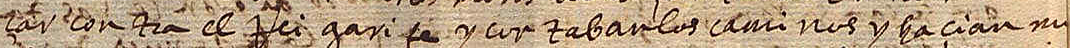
çar contra el Rei garife y cortaban los caminos y hacian m
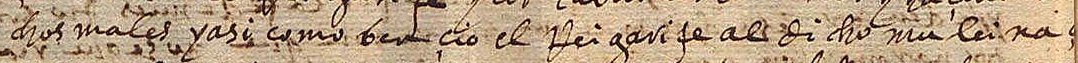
chos males y asi como bencio el Rei garife al dicho mulei naç
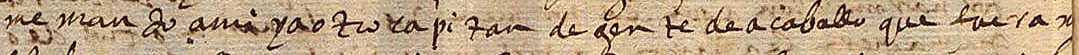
me mando a mi y a otro capitan de gente de a caballo que fuera n
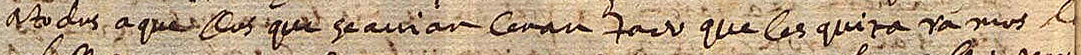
a todos aquellos que se auian leuantado que los quitaramos d
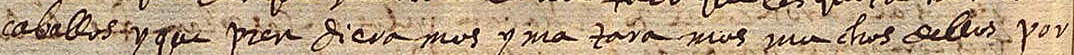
caballos y que prendieramos y mataramos muchos dellos por
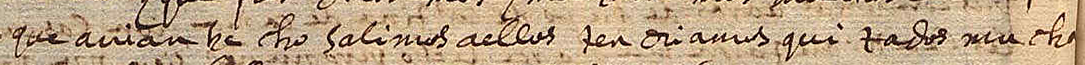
que auian hecho salimos a ellos tendriamos quitados mucho
